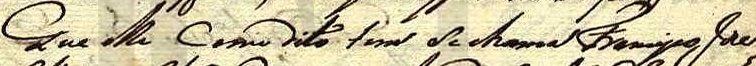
Que elle Como dito tem se chama Francisco Joze
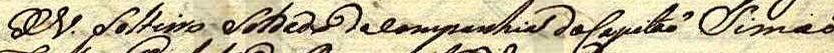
XV. Solteiro soldado da companhia do Capitaõ Simaõ
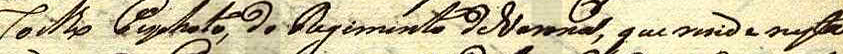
Coelho Peychoto, do Regimento de Varena, que reside nesta
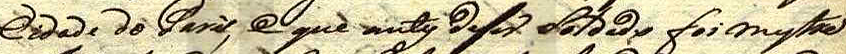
cidade do Pará, e que antes de ser soldado foi mestre
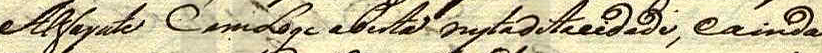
Alfayate Com Loge aberta nesta dita cidade, e ainda
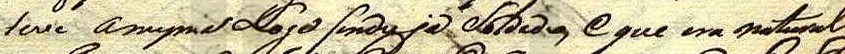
teve a mesma Logo sendo ja Soldado, e que era natural
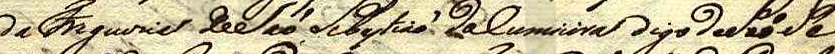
da Freguezia de Saõ Sebastiaõ da Cumieira digo de Saõ Se
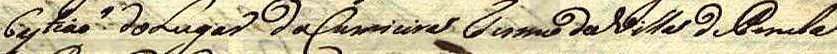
bastiaõ do Lugar da Cumieira Termo da Villa de Penela
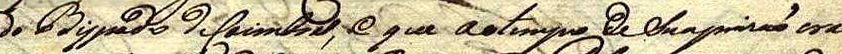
do Bispado de Coimbra, e que ao tempo de Sua prizaõ era
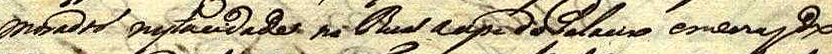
morador nesta cidade na Rua ao pe do Palacio em cazas do
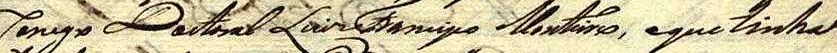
Conego Doctoral Luiz Francisco Monteiro, e que tinha
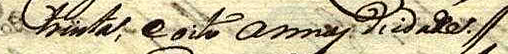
trinta, e oito annos de idade. //
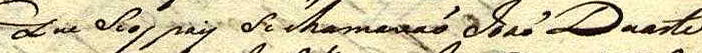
Que seos pais se chamavaõ Joaõ Duarte
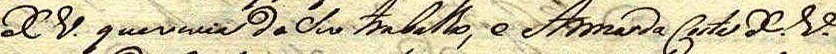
XV. que vivia do Seo trabalho, e Anna da Costa X.V.
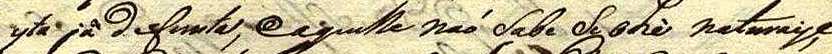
esta ja defuncta, e aquelle naõ sabe se o hé naturais, e
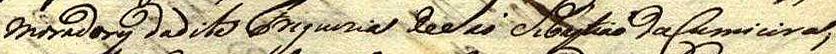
moradores da dita Freguezia de Saõ Sebastião da Cumieira,
